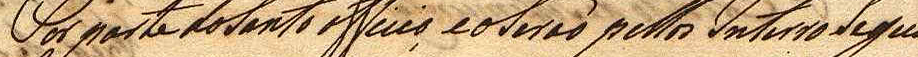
Por parte do Santo officio, e o Seraõ pellos Interro Segu
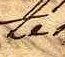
tes:
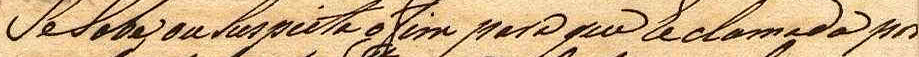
Se Sabe ou suspeita o fim para que he chamado por
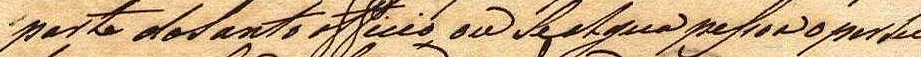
parte do Santo officio ou se algua pessoa o persu
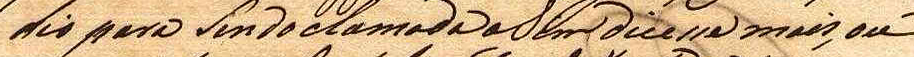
dio para sendo chamado aSim dicesse mais, ou
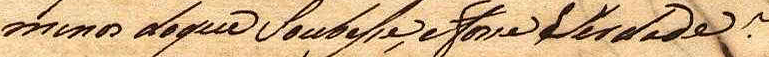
menos, do que Soubesse, e fosse Verdade.
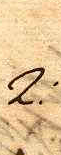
2.
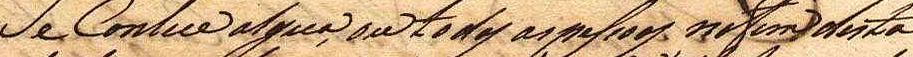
Se Conhece algūa, ou todas as pessoas no fim desta
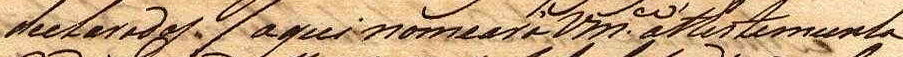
declaradas / aqui nomeará V M.ce a thestemunha
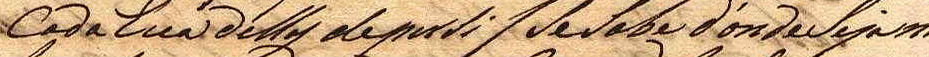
Cada hua dellas de per si / Se Sabe d´onde Seja n_
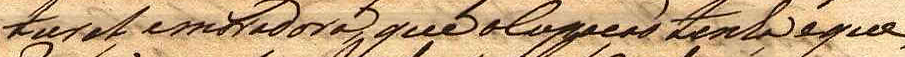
tural, e moradora, que Ocupação tenha, e que
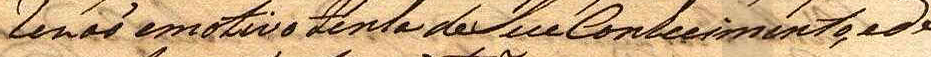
Rezaõ e motivo tenha de Seu Conhecimento, e de
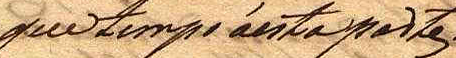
que tempo a esta parte:
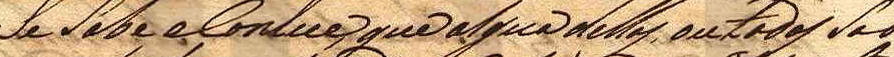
Se Sabe e Conhece que algua dellas ou todas saõ
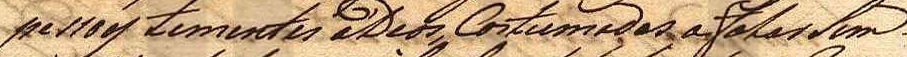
pessoas tementes a Deos, Costumadas a falar sem
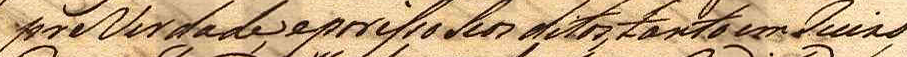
pre Verdade, e por isso seos ditos, tanto em Iuizo,
